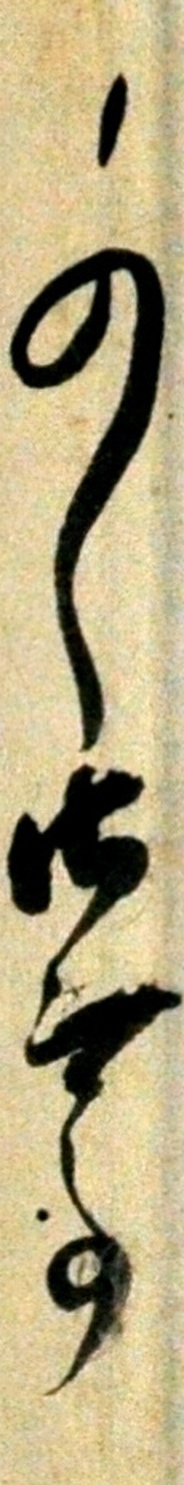尚々御無事
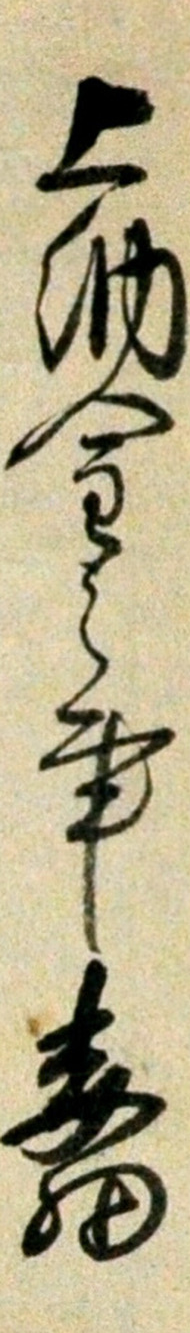上納金之事委細
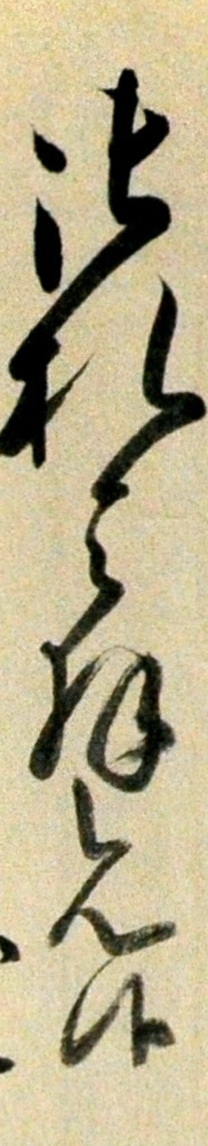御札令拝見候
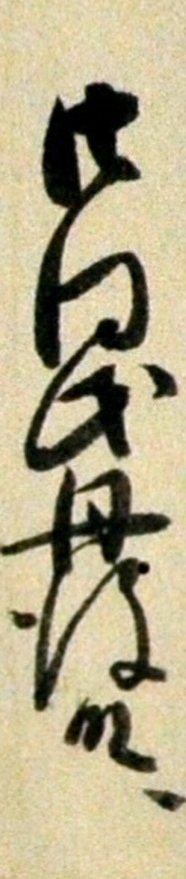御同氏丹後殿へ
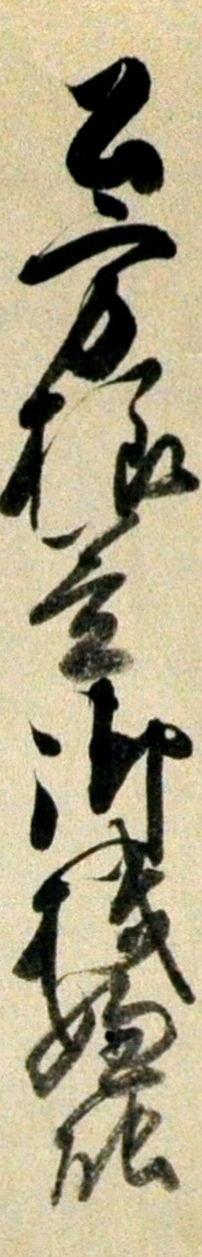公方様益御機嫌能
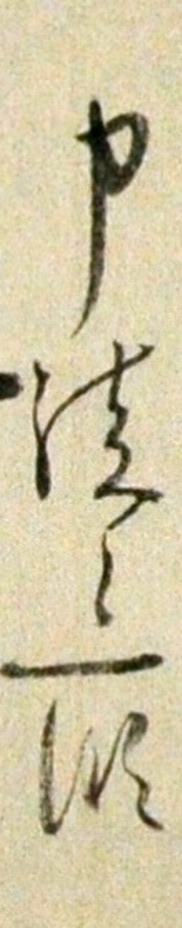申談候一段
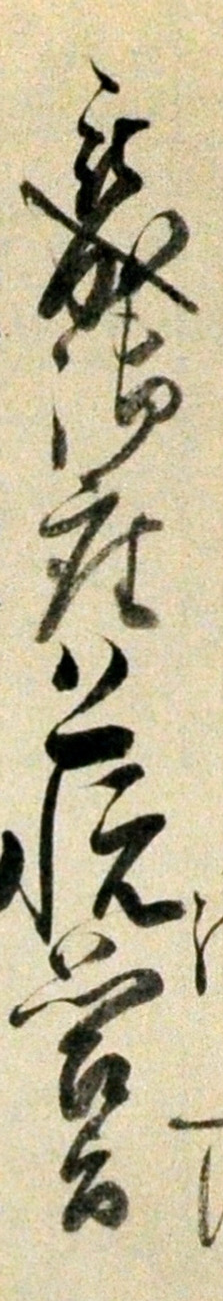被成御座恐悦思召旨
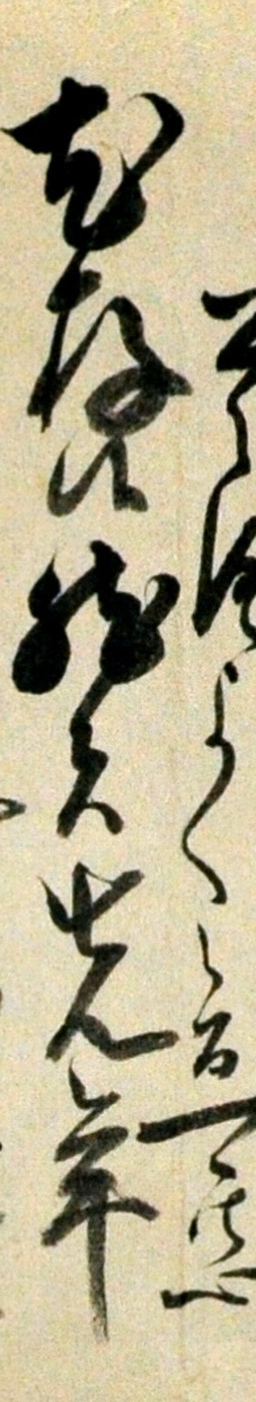尤存候然者先年
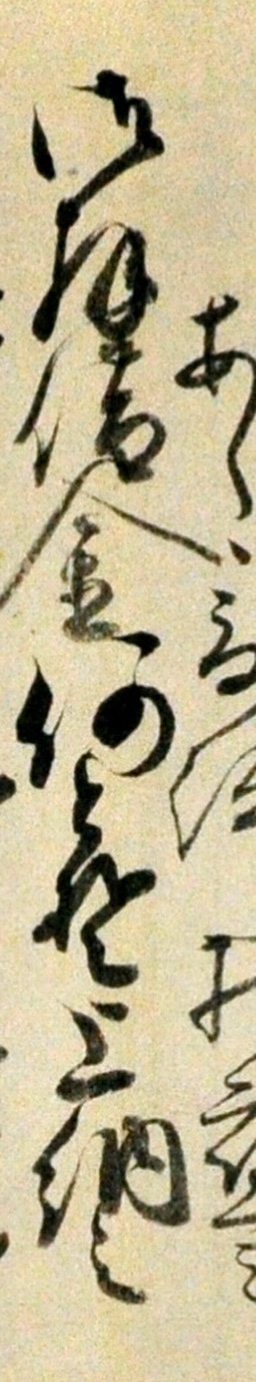御拝借金何とそ上納之
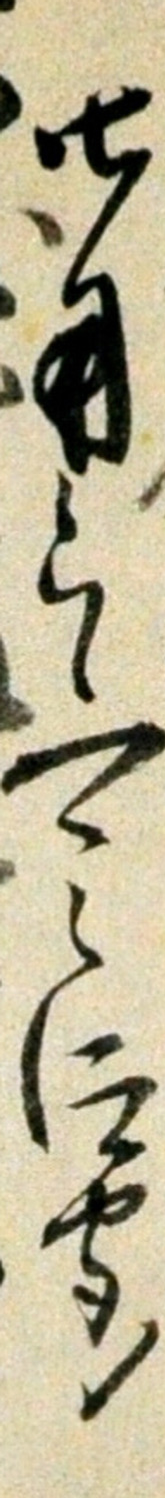御用候はゝ可被仰聞候
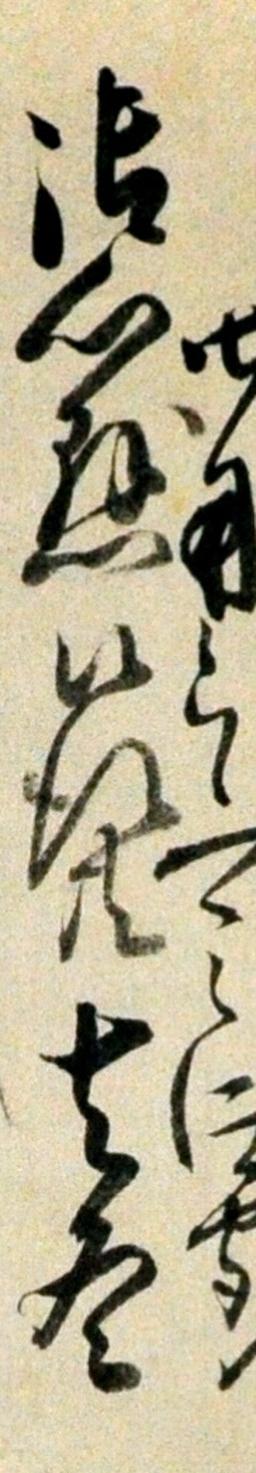御心懸候得共去冬
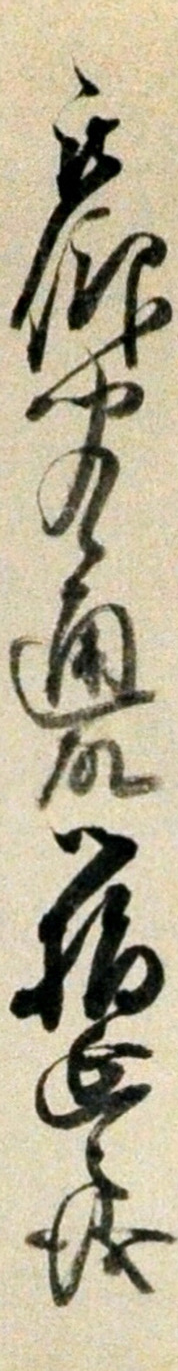被仰聞候通故御指延之儀
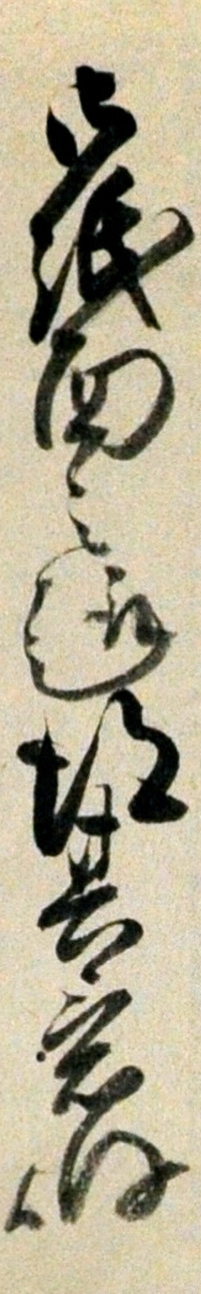御紙面之趣得其意存候
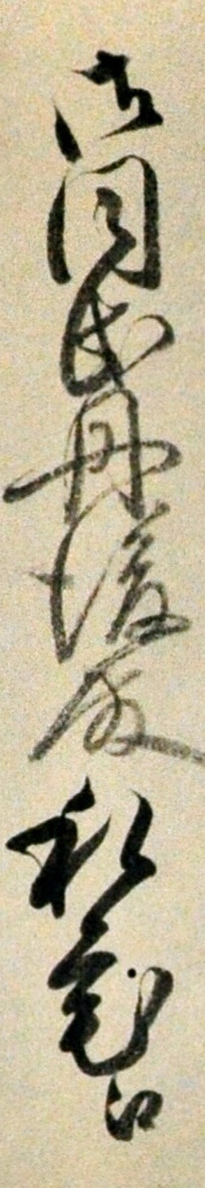御同氏丹後殿私宅江
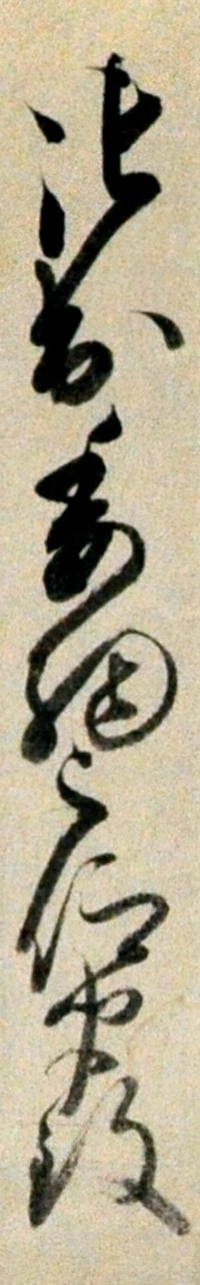御出委細被仰聞致
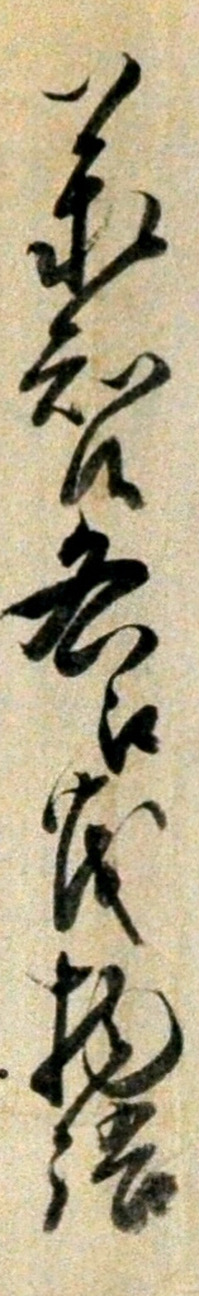承知候各江茂物語
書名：書状
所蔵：伊那市立高遠町図書館・合同会社AMANE
